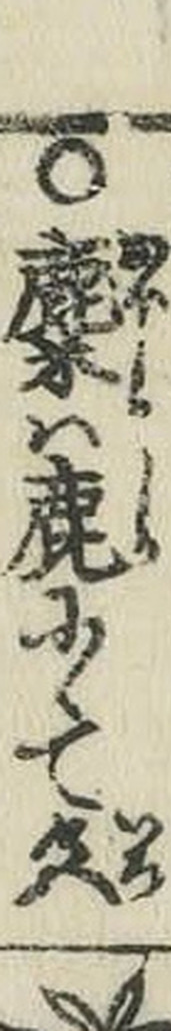○麋は鹿にゝて色
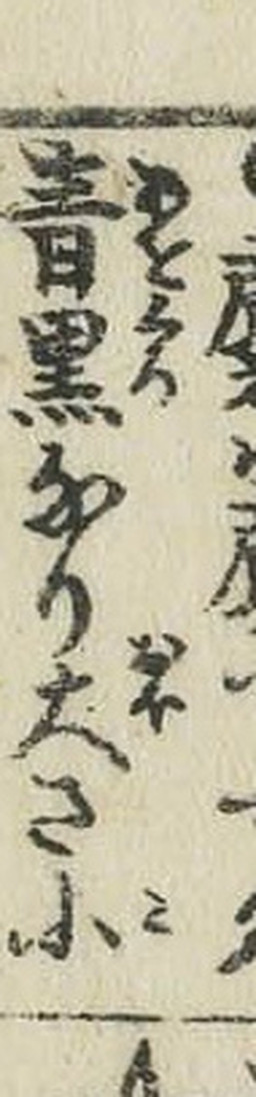青黒なり大さ小
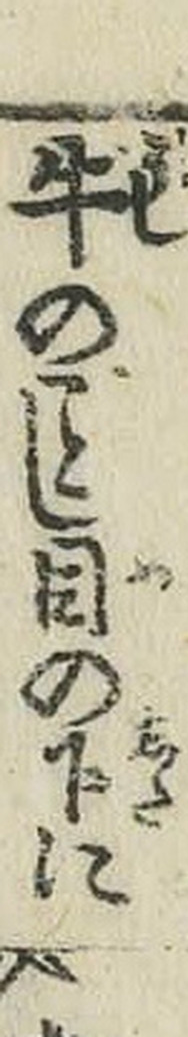牛のごとし目の下に
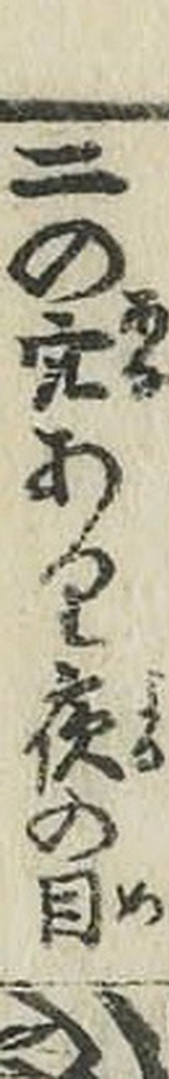二の穴あり夜の目
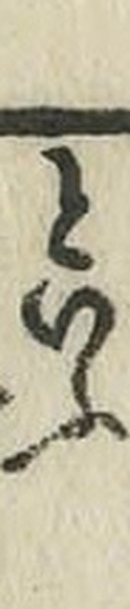といふ
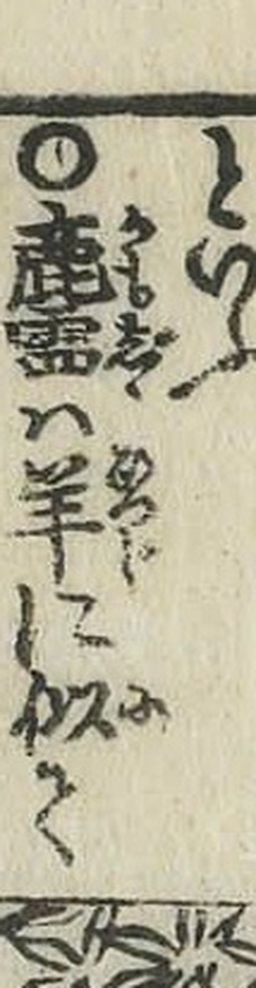○麢は羊に似て
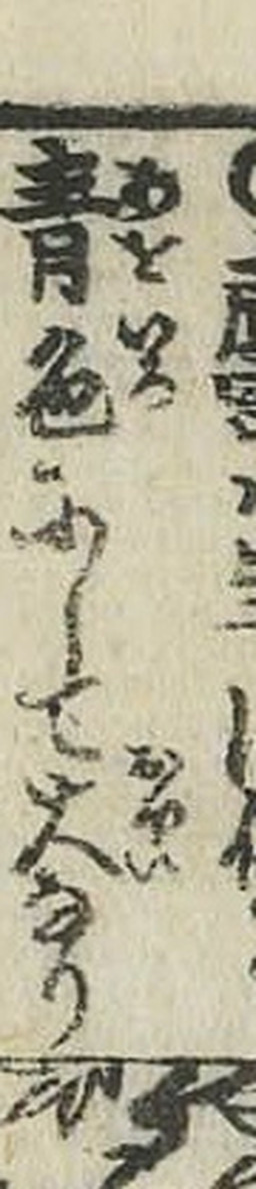青色にして大なり
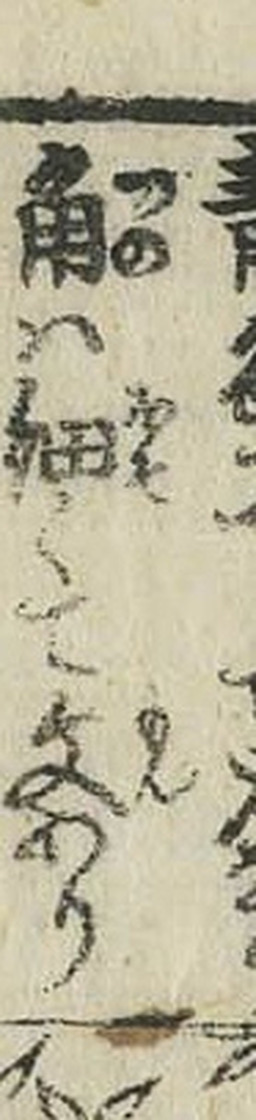角は細くて文あり
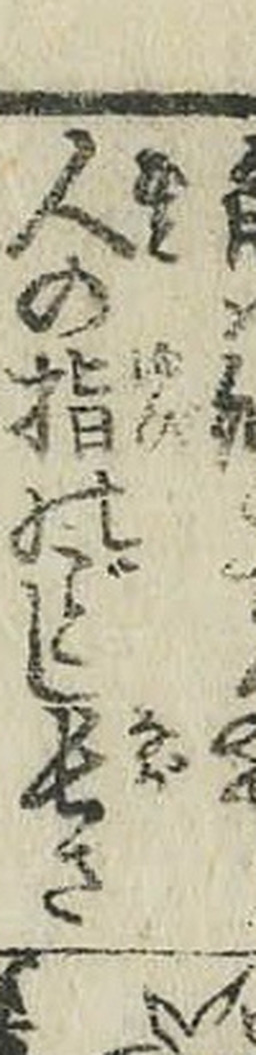人の指のごとし長さ
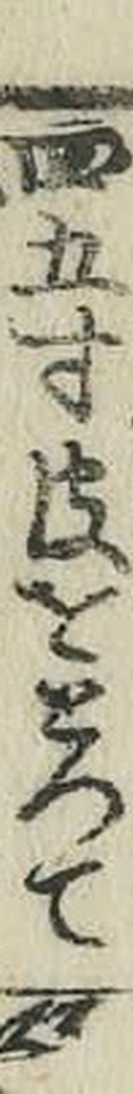四五寸皮をとつて
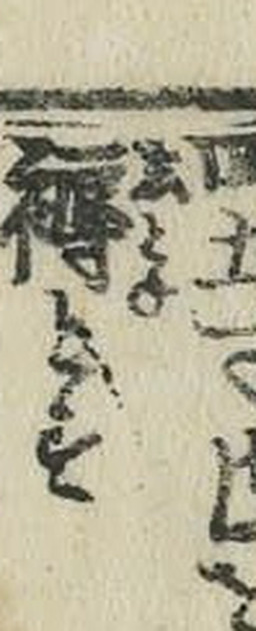褥とす

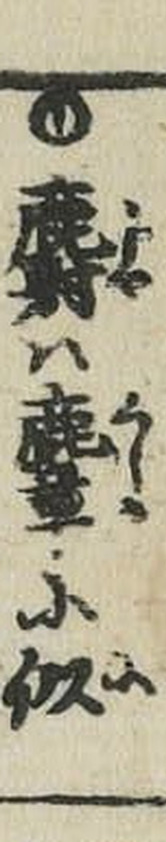○麝は麞に似
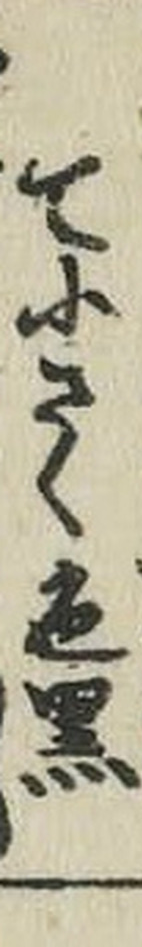て小さく色黒し
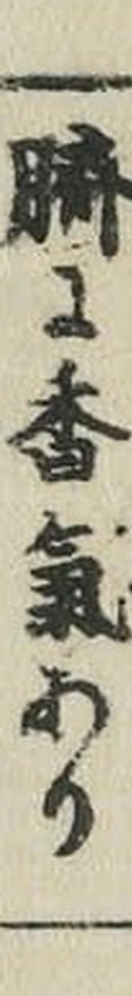臍に香気あり
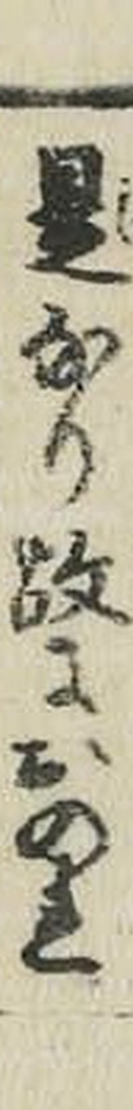是なり故におのれ
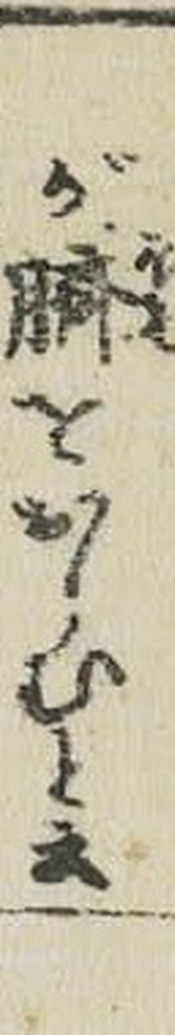が臍をおしむと云
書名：増補頭書訓蒙図彙大成 10巻 6:巻之12-13
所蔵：東京学芸大学教育コンテンツアーカイブ
